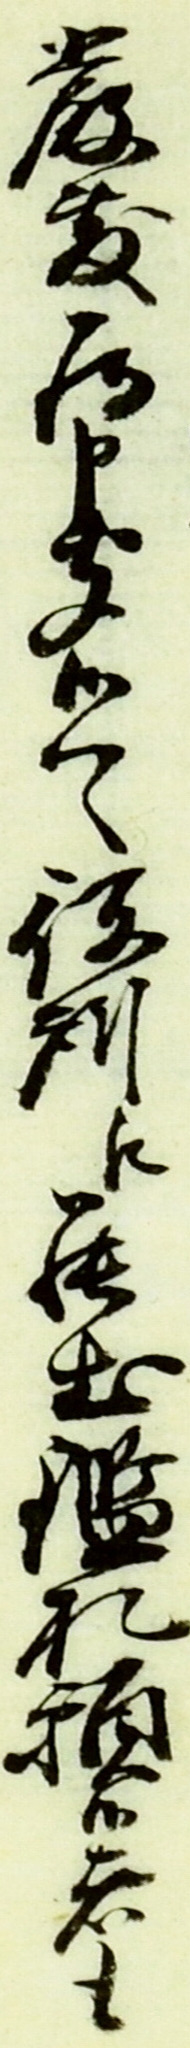厳敷為申聞候ハヽ役所江罷出鑑札願候者も
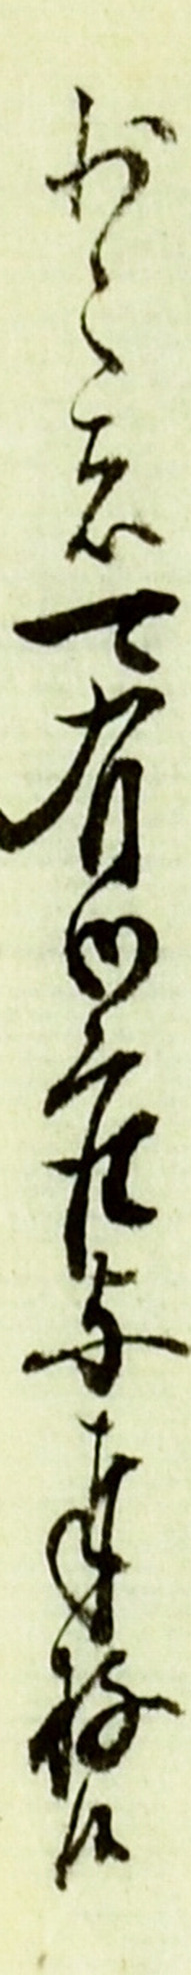少々者可宇有御座与奉存候
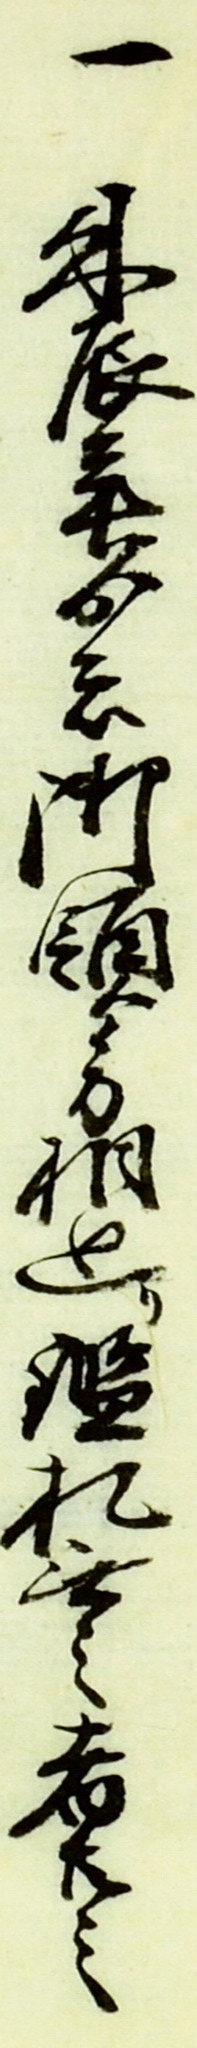一来辰年ゟ者御領方相廻り鑑札無之者共之
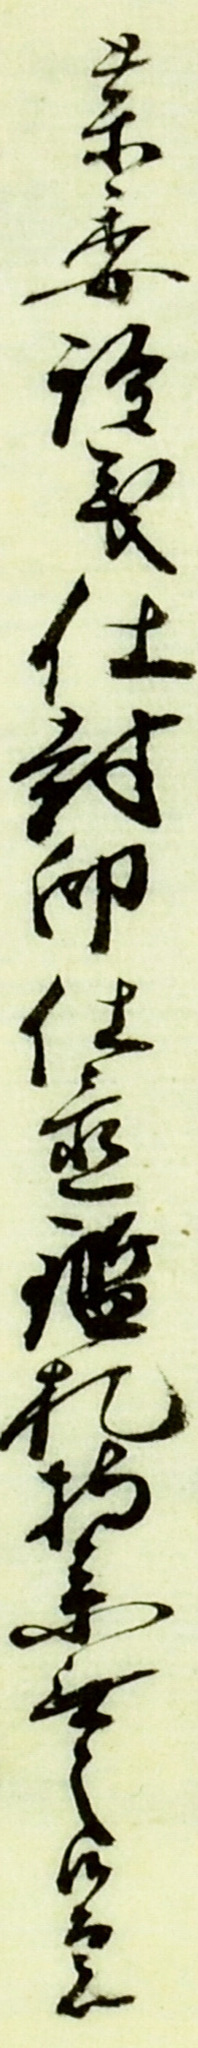薬委詮義仕封印仕置鑑札持参無之候而者
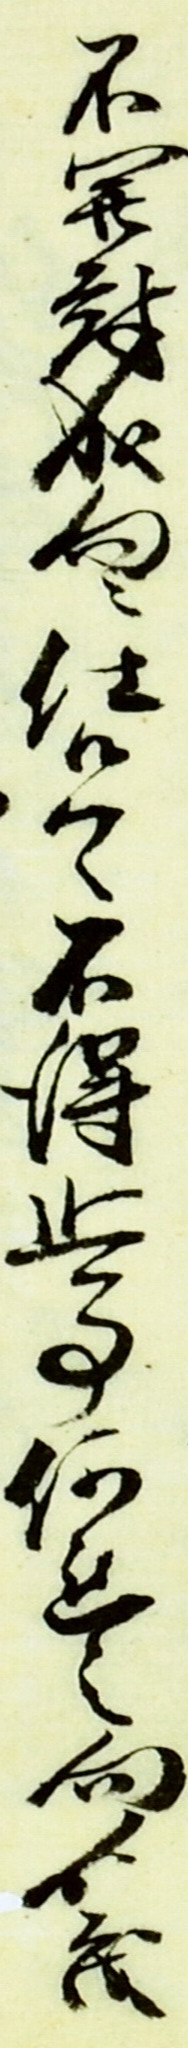不開封成向ニ仕候ハヽ不得止事何れ之向ゟ茂
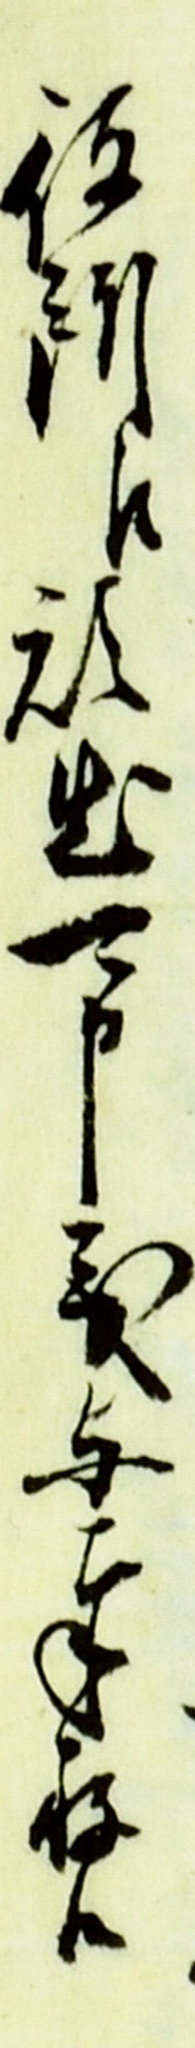役所江願出可申義与奉存候
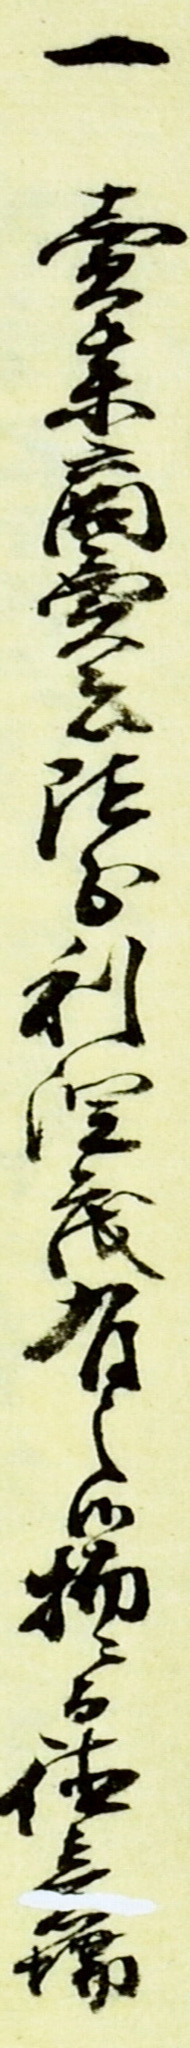一売薬商売者随分利潤茂有之候砌ニ而徳兵衛
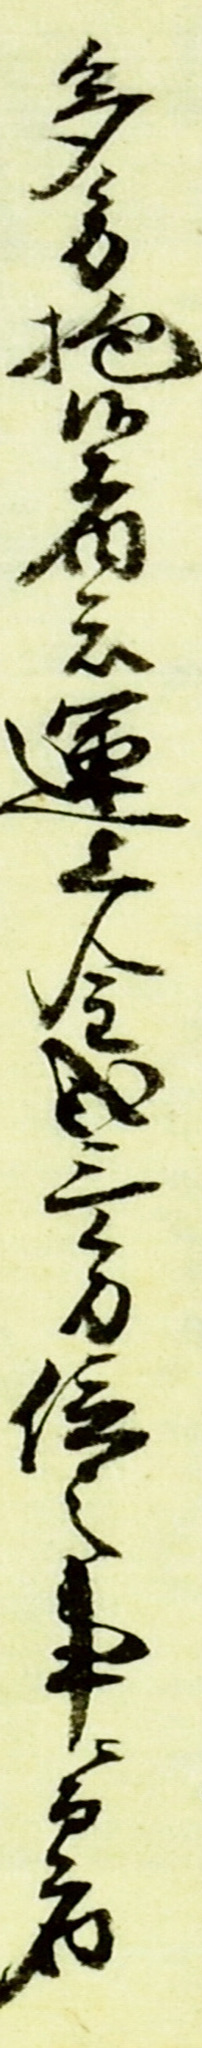多方抱候者者運上金弐三方位之事ニ而者
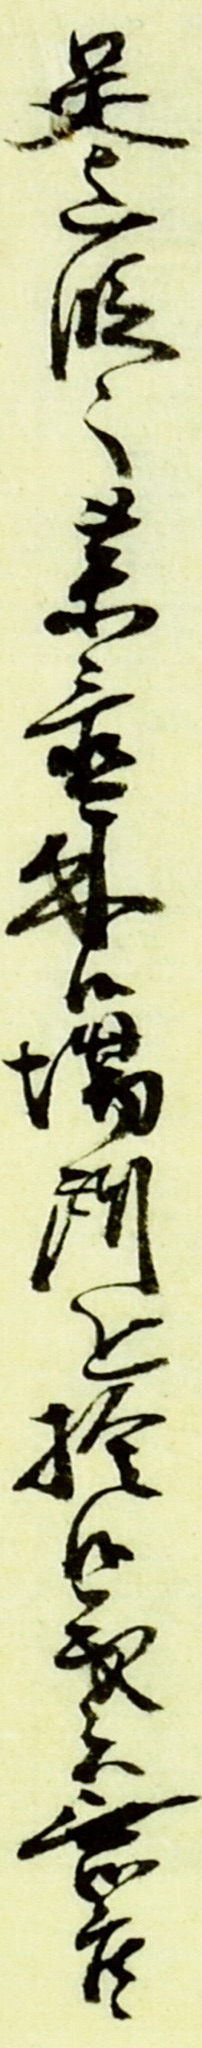是迄段々薬置来候場所を捨候義者無御座
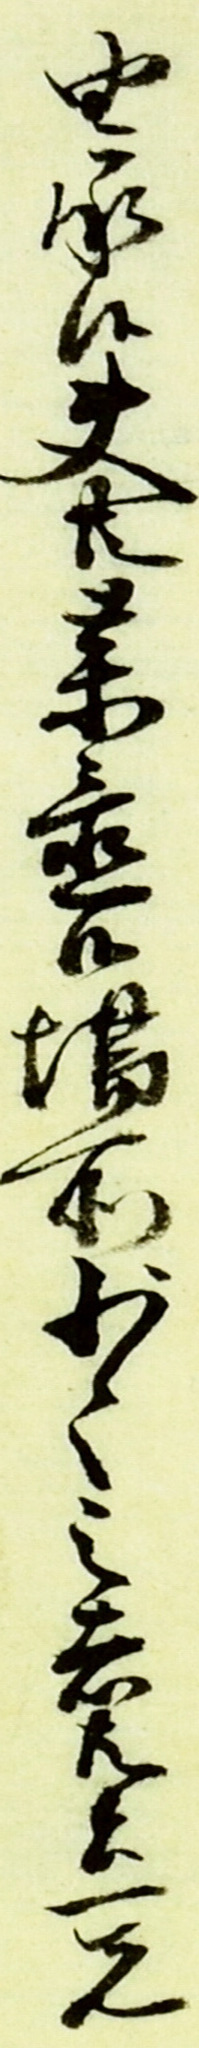由承候夫共薬置候場所少々之者共者一先
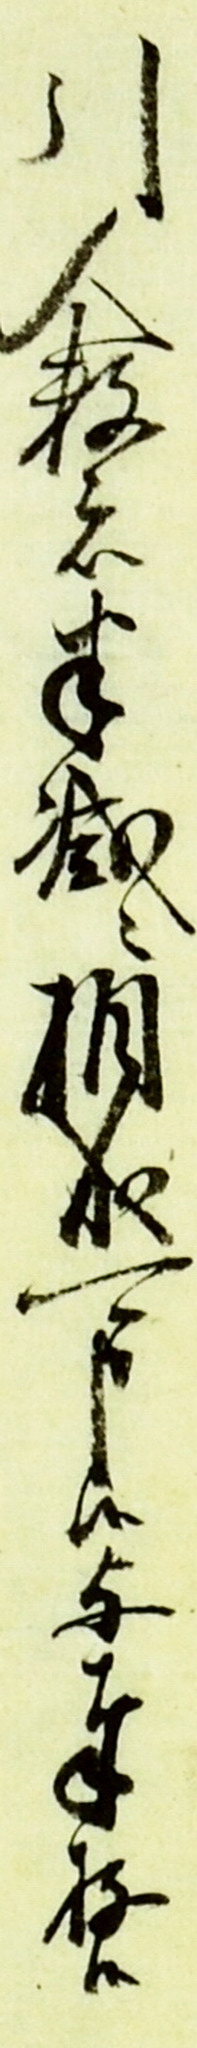引人数者半減ニ相成可申候与奉存候
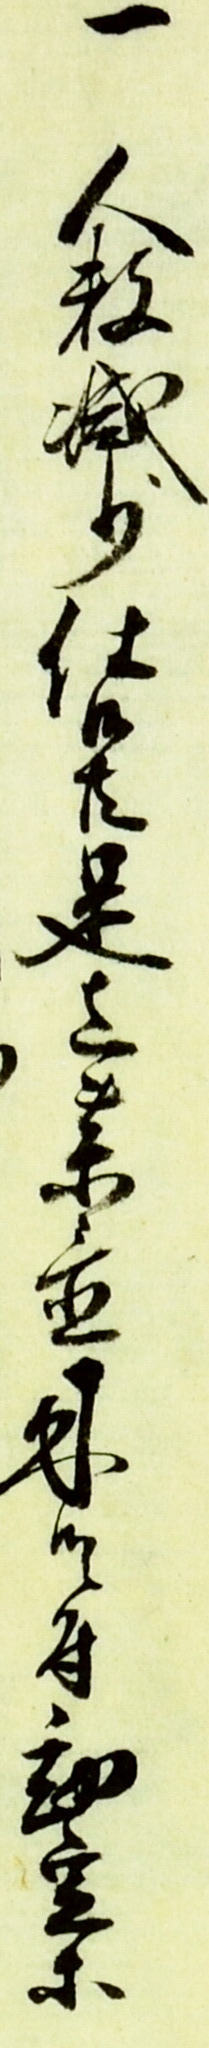一人数減少仕候共是迄薬置来候ニ付勘定等
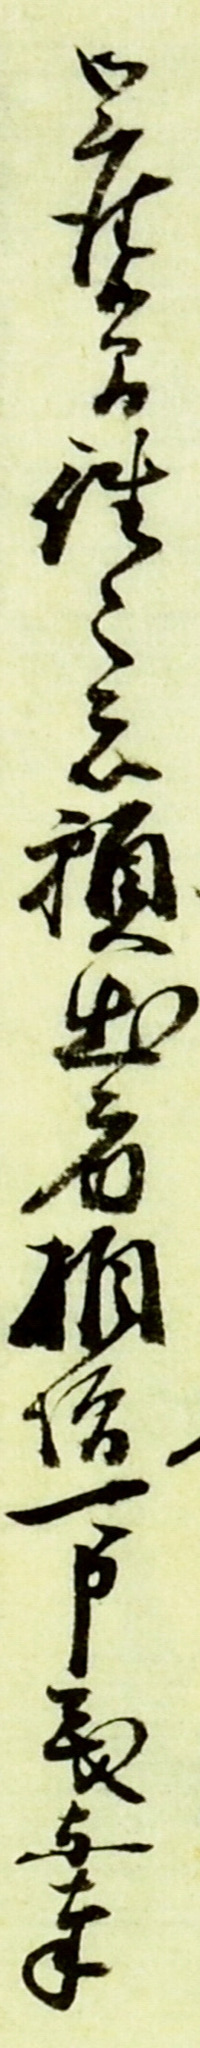御座候間往々者願出者相増可申義与奉
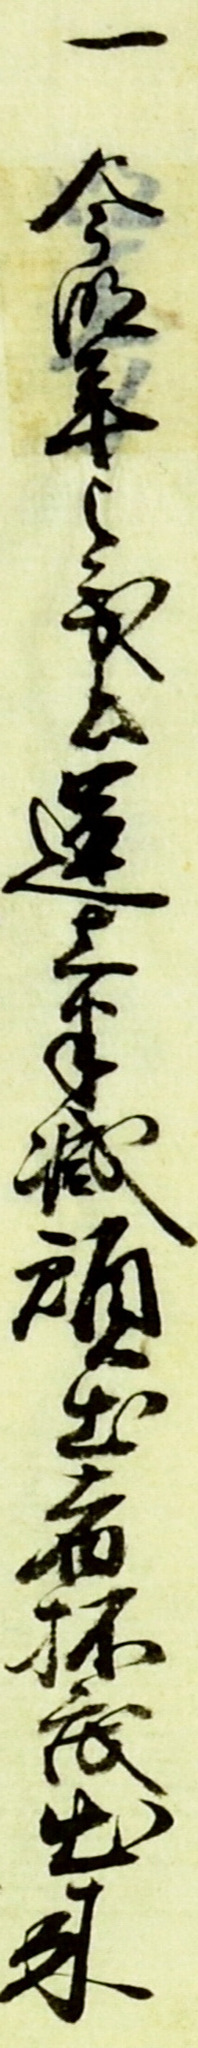一今明年之義者運上半減願出者抔茂出来
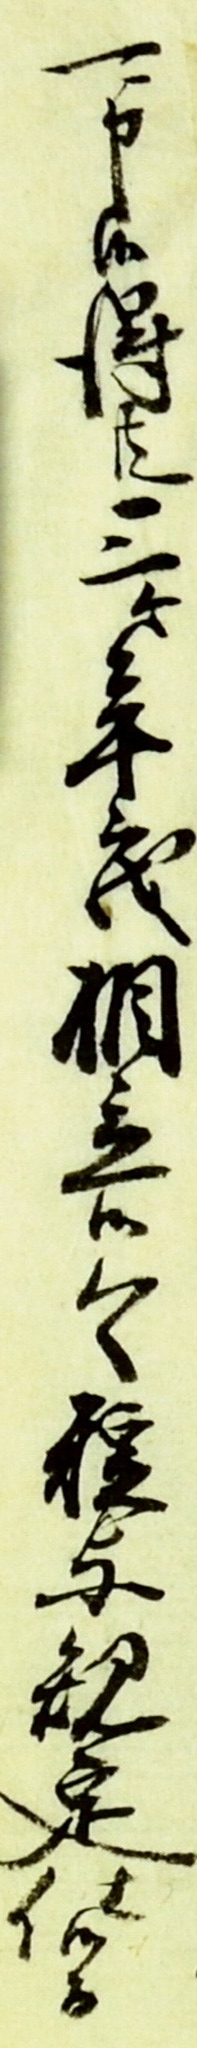可申候得共三ヶ年茂相立候ハヽ聢与規定仕候而

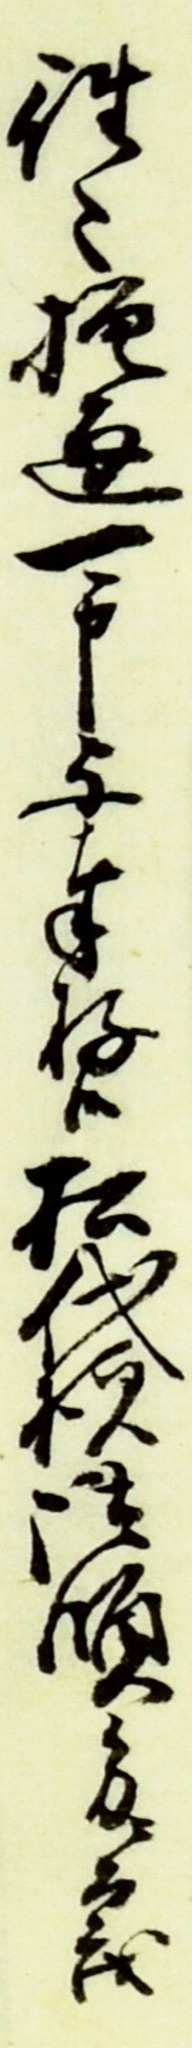往々抱通可申与奉存候松代様御領方ニ而茂
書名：他国賣薬師運上之事
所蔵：伊那市立高遠町図書館・合同会社AMANE
